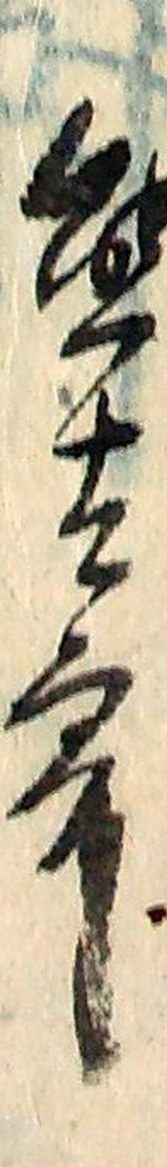熊太郎
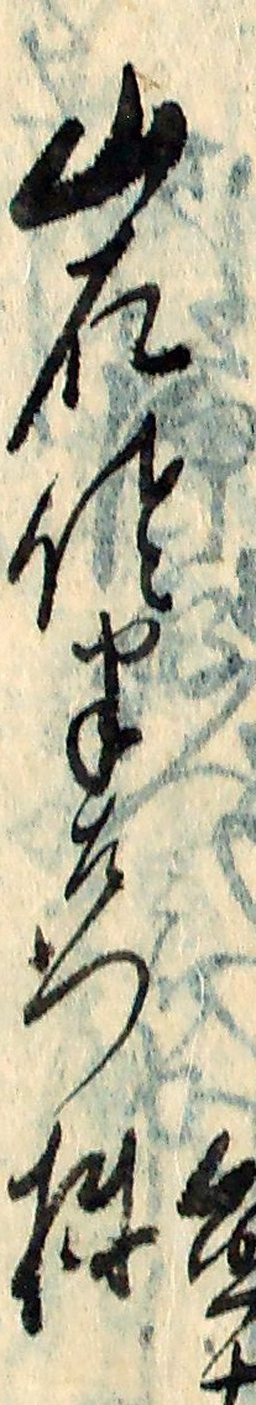岩佐半左衛門様
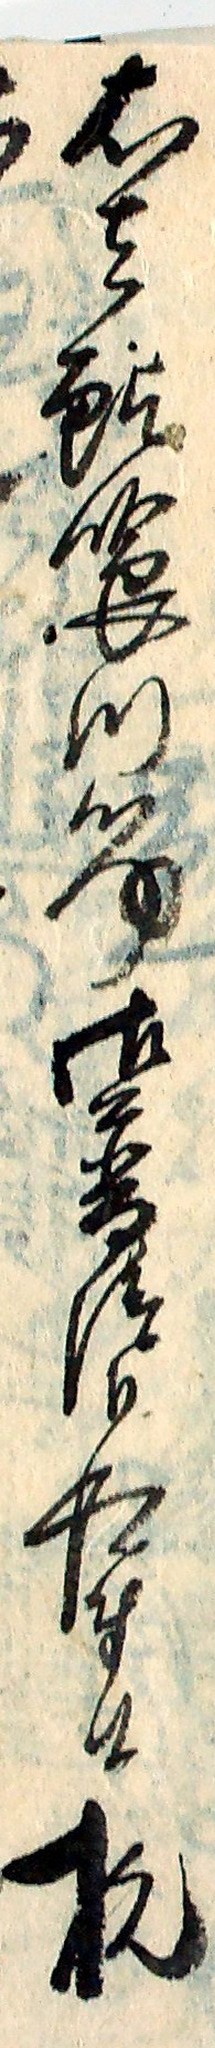右は鮎喰川筋御普請被仰付候杭
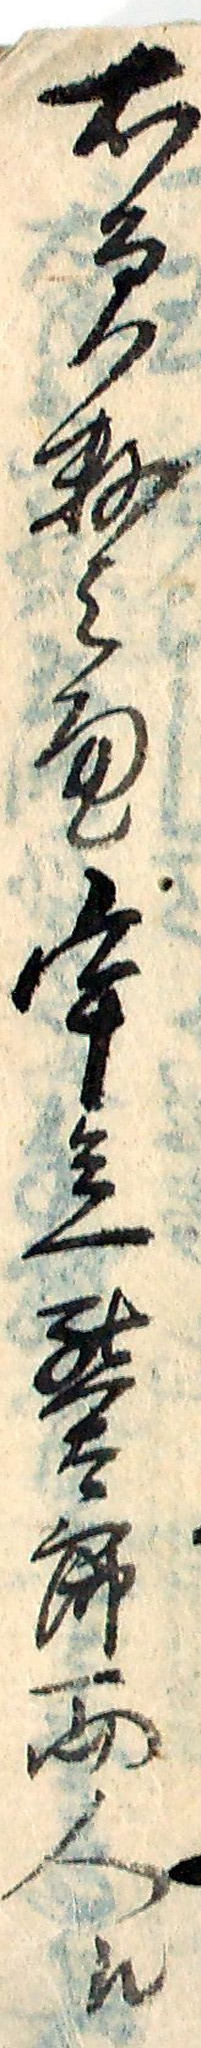右員数之通宇兵衛熊太郎両人え

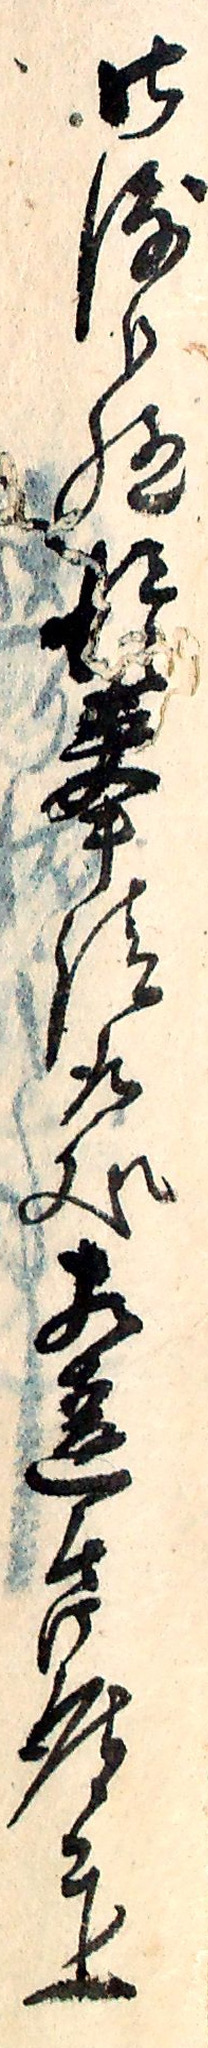御渡被遊慥に奉請取処相違無御座候已上
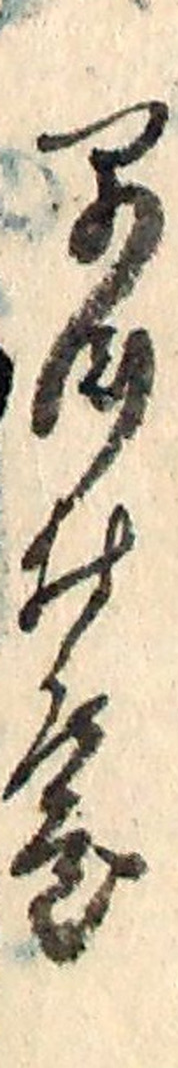早淵村庄屋
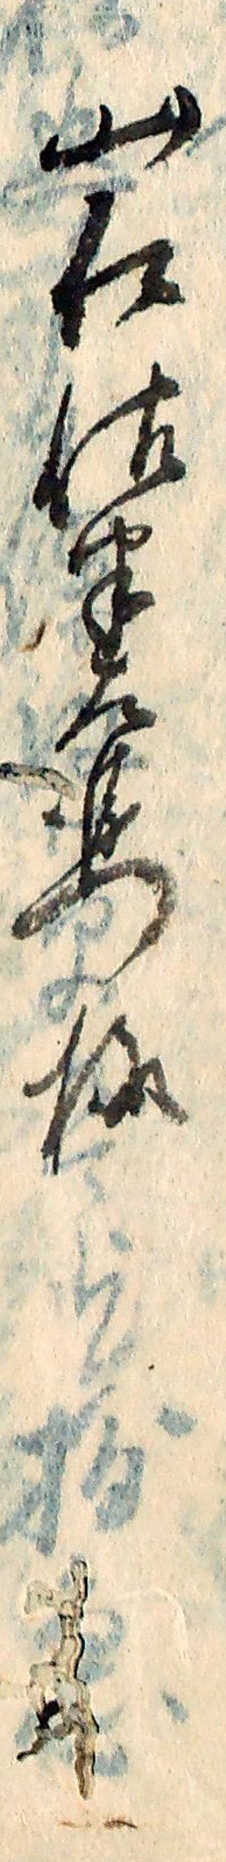岩佐半左衛門様
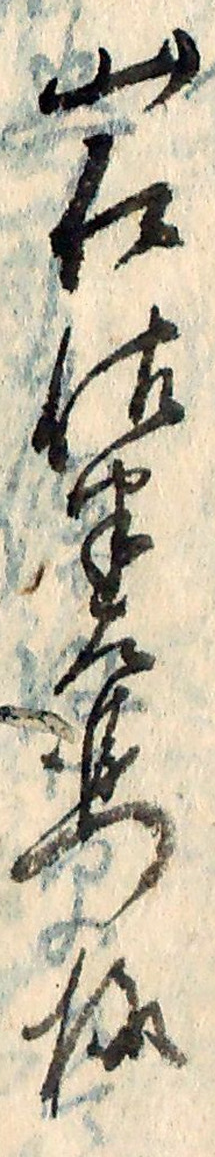岩佐半左衛門様
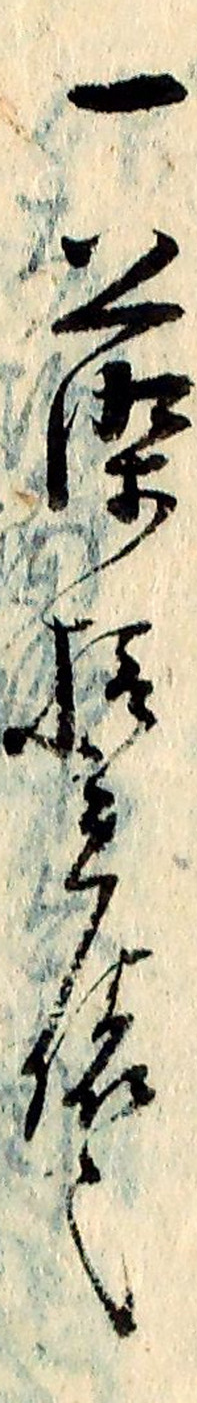一蒅拾壱俵也
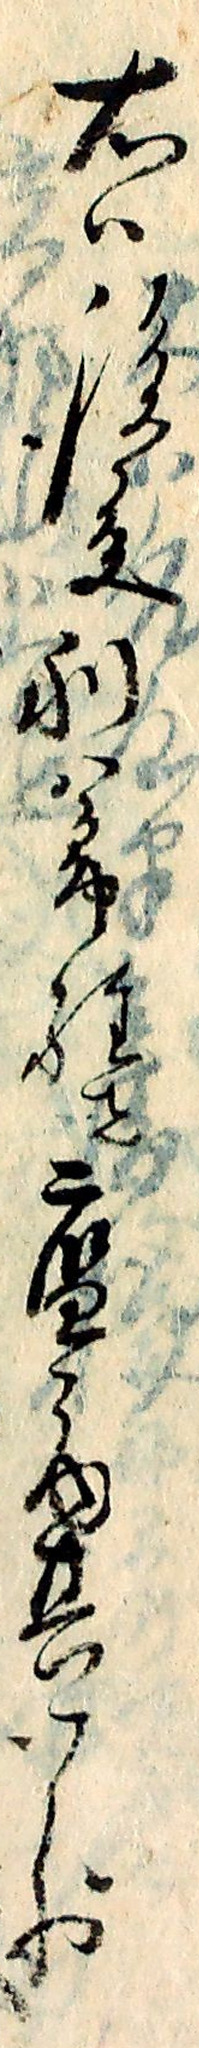右は後藤利八郎種は藍商其御村
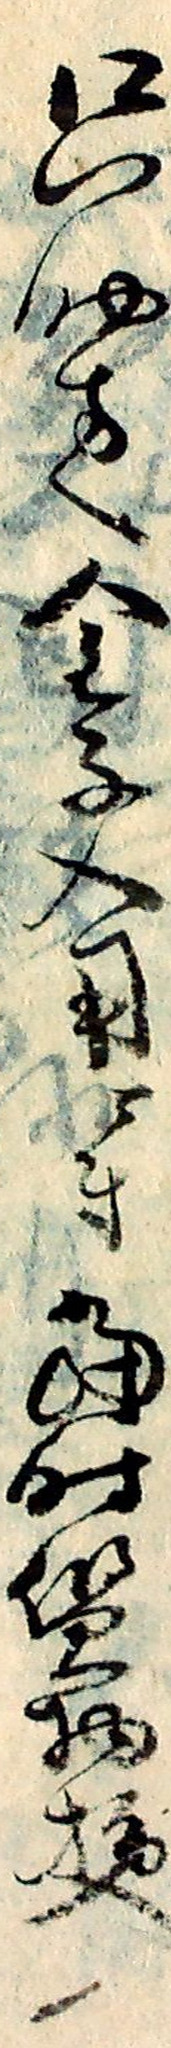只助方へ金子入用に付当時質物指入
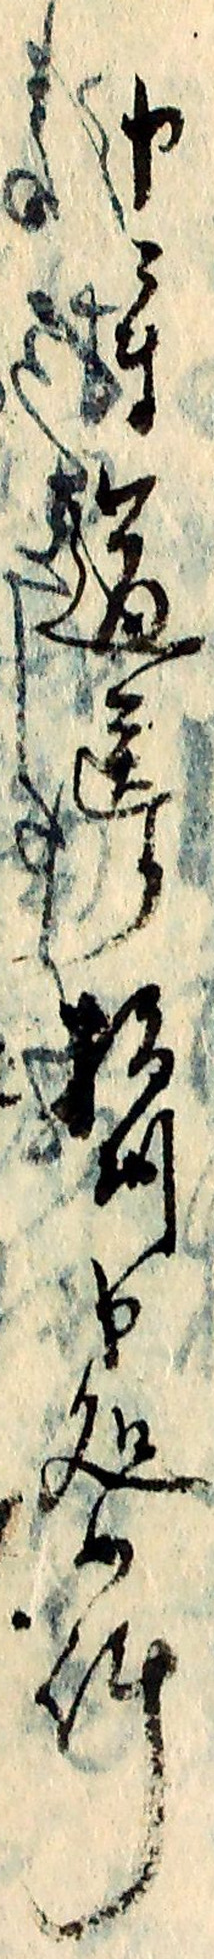中に付道送り指出し申処如件
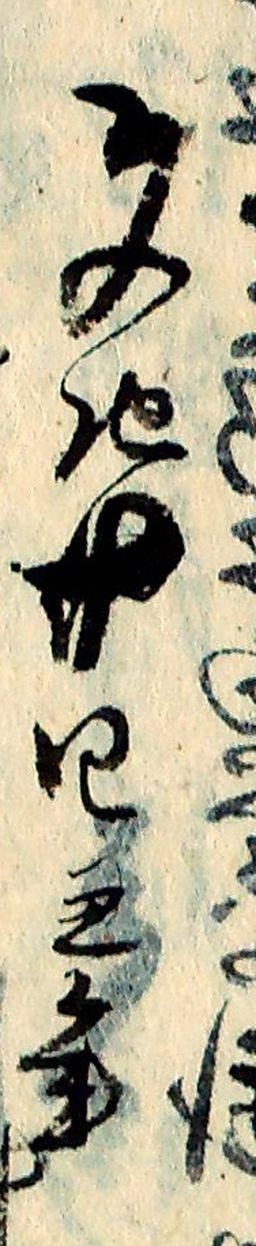文化十四丑年十
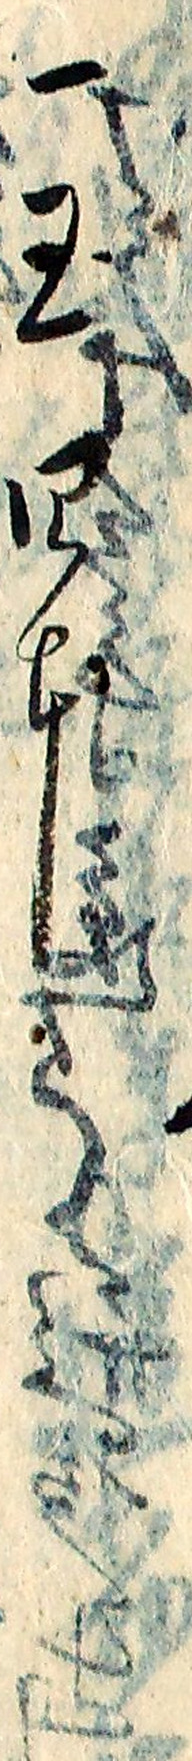一玉四本
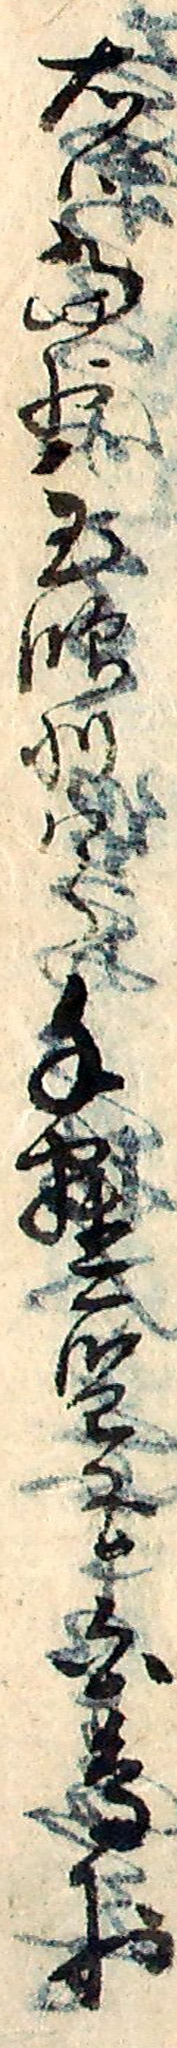右は当村玉師利八郎手寐藍玉白鳥村

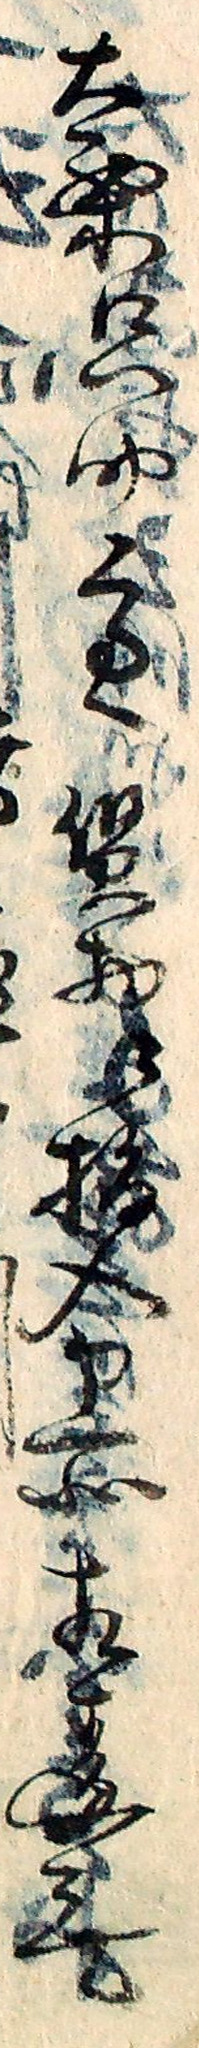太栗只助方へ質物に指入申所相違無
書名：諸御願書控(後藤氏壱番）
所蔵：鳴門教育大学 Naruto University of Education
